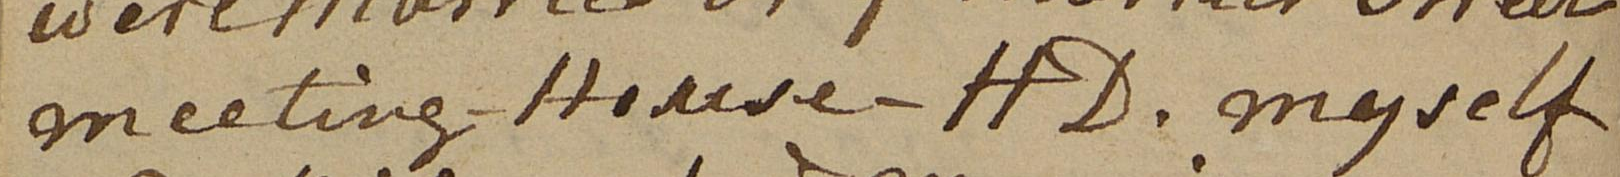meeting House- HD. myself
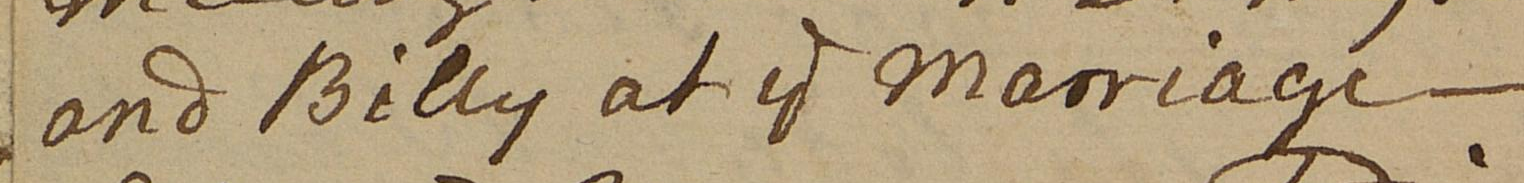and Billy at y^e Marriage-
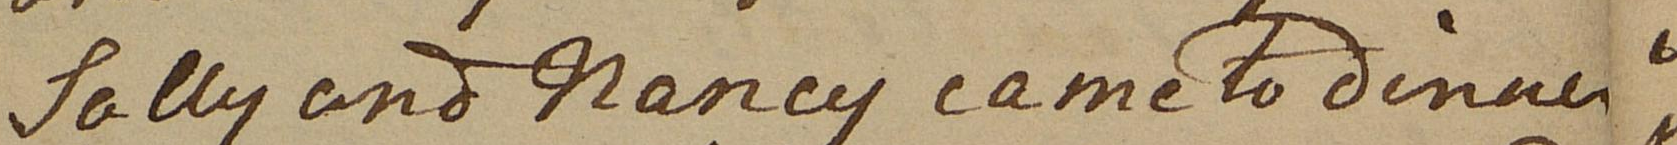Sally and Nancy came to dinner
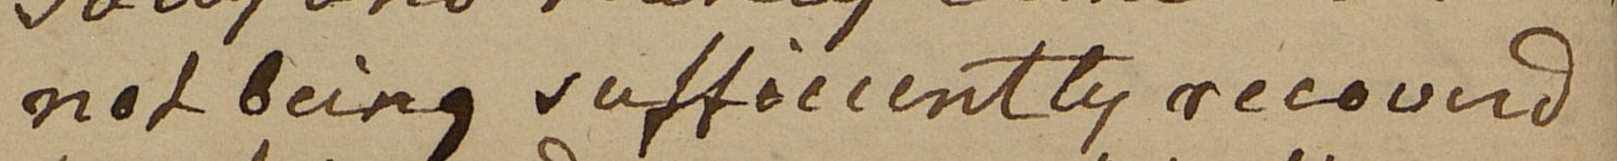not being sufficiently recoverd
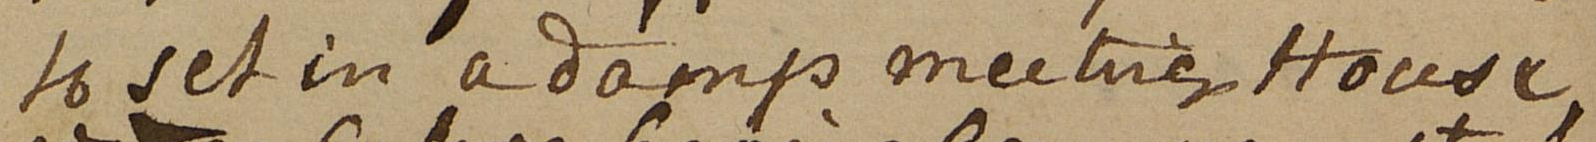to set in a damp meeting House,
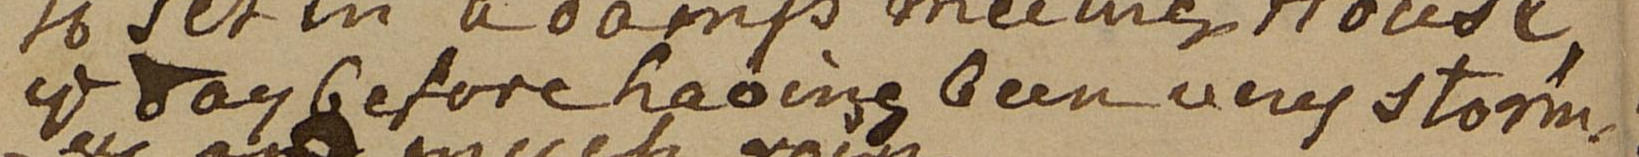y^e day before having been very storm-
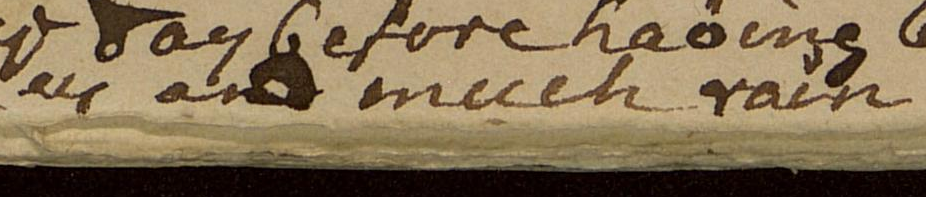-ey and much rain
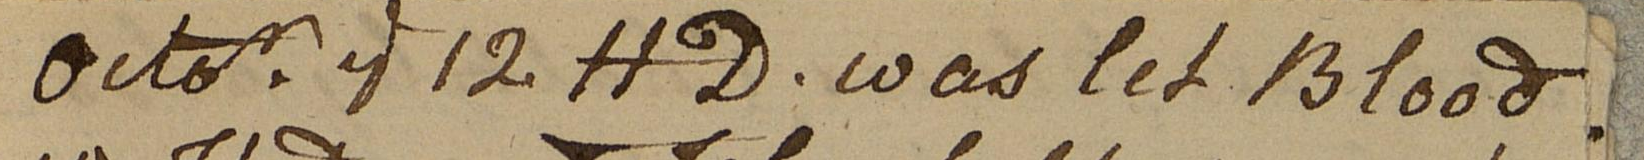Octo^r. y^e 12 HD. was let Blood
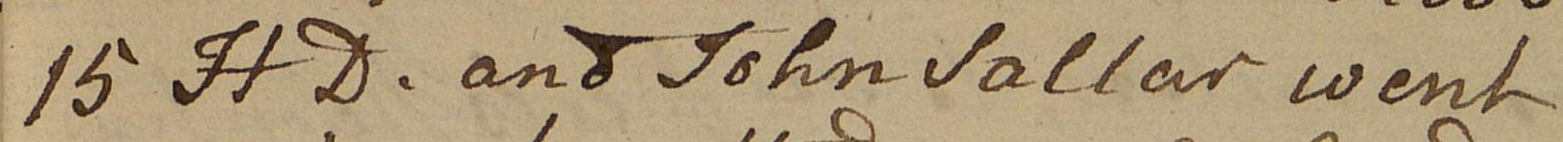15 HD. and John Saltar went
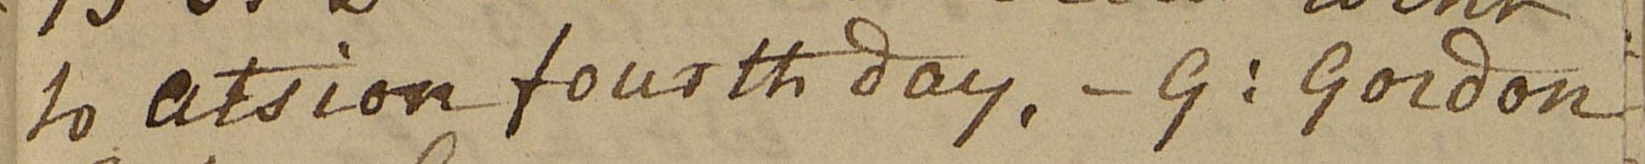to Atsion fourth day,- G: Gordon
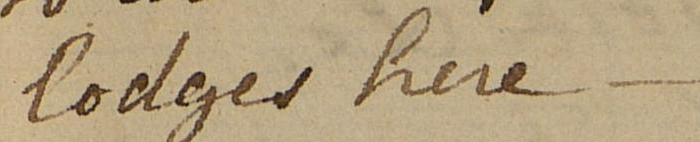lodges here-
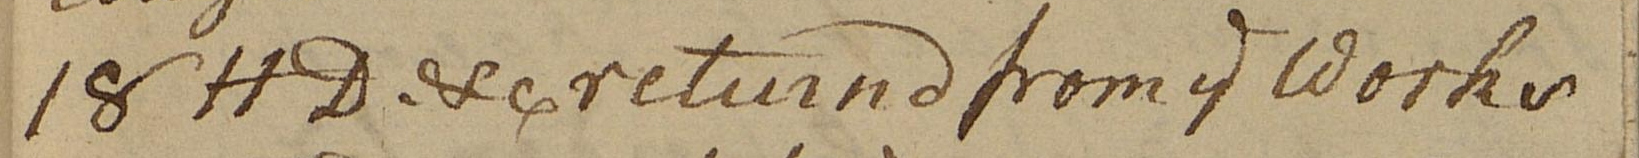18 HD &c returnd from y^e Works
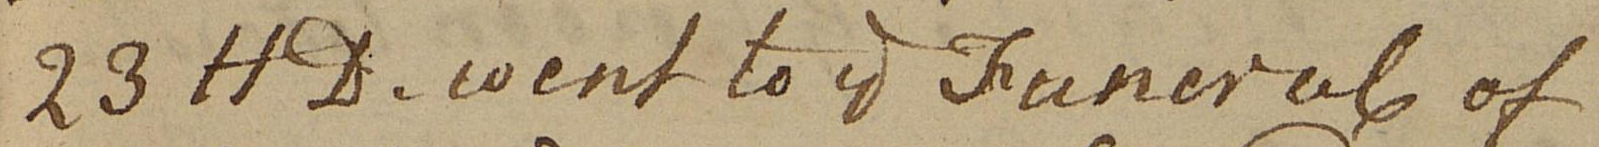23 HD-went to y^e Funeral of
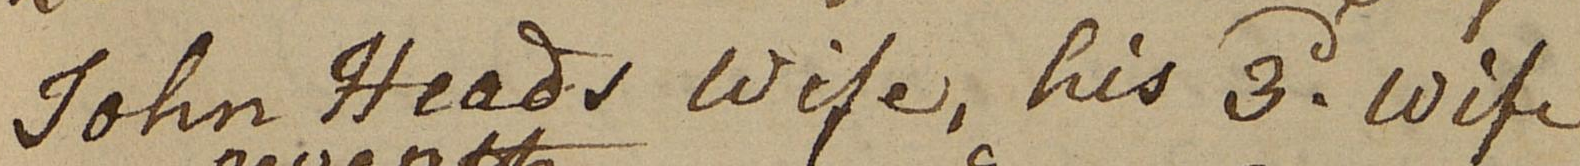John Heads wife, his 3^d. wife
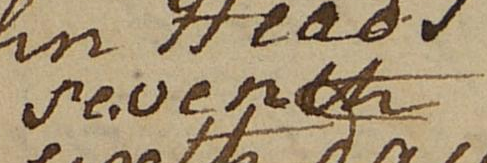seventh
